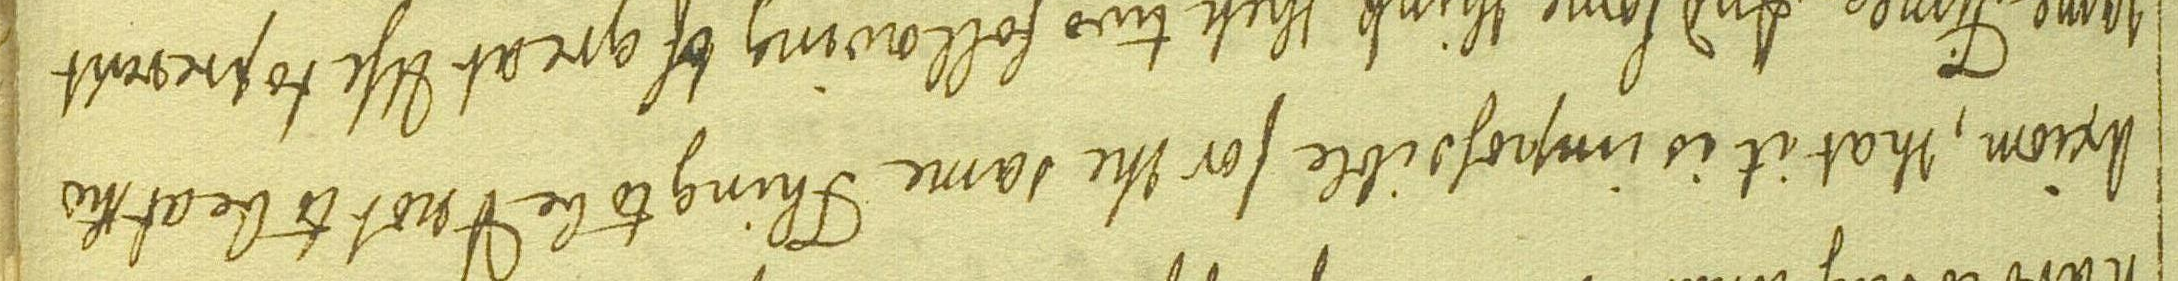Axiom, that it is impossible for the same Thing to be & not to be at the
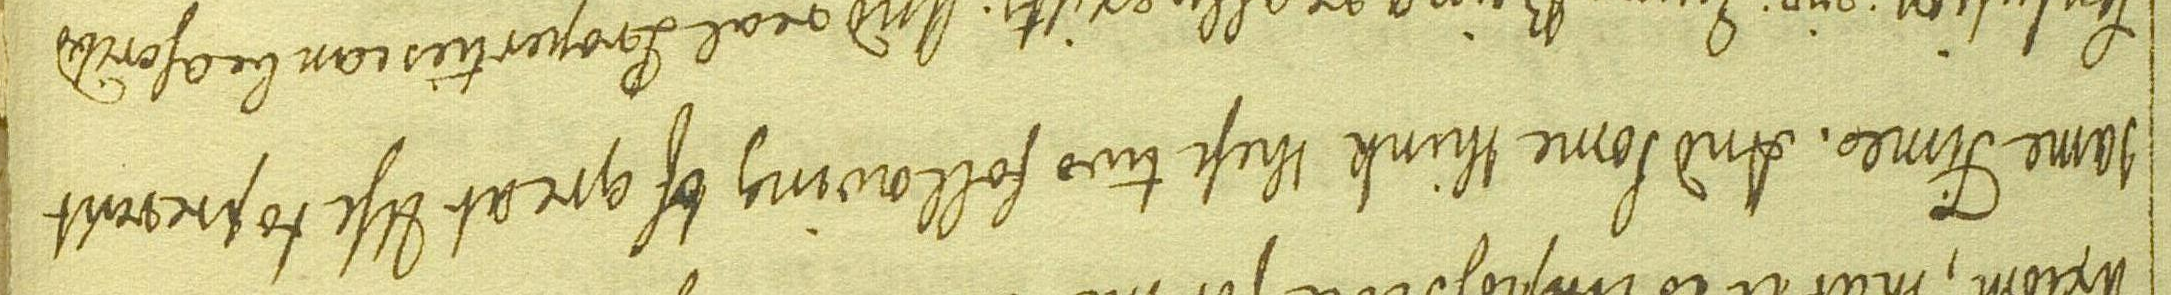same Time. And Some think these two following of great Use to prevent
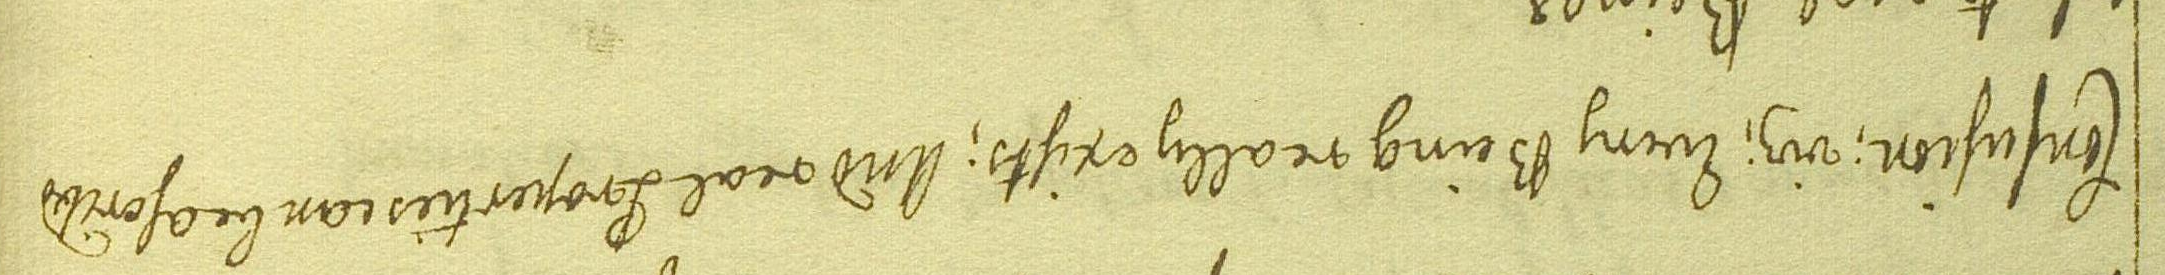Confusion; viz; Every Being really exists; And real Properties can be ascrib'd
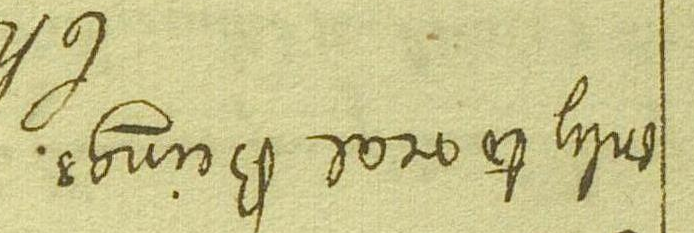only to real Beings.
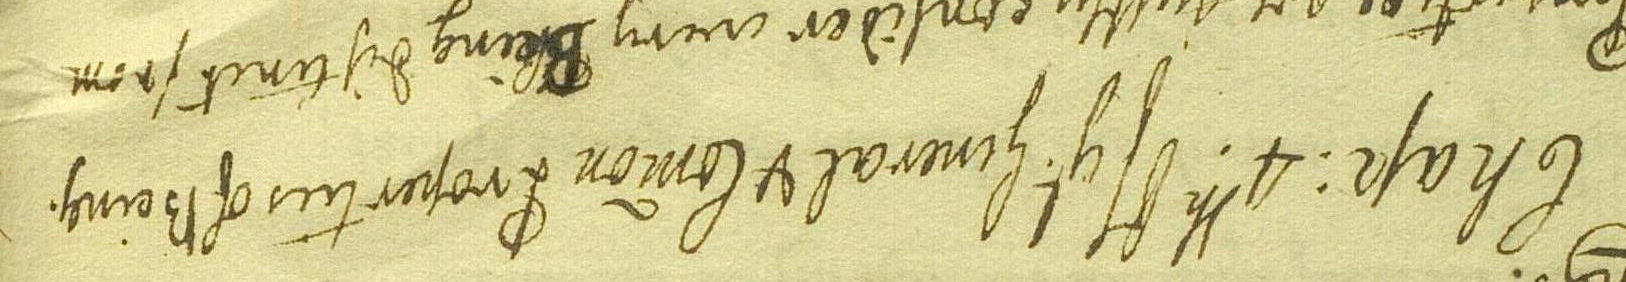Chap: 4^th. Of y^e General & Com̄on Properties of Being.
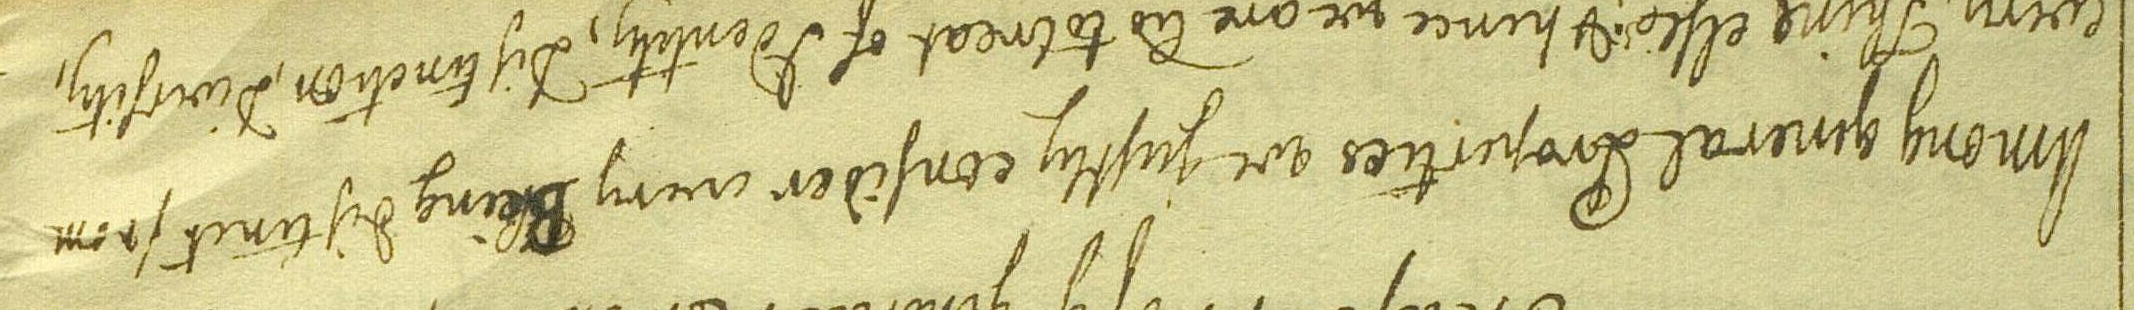Among general Properties we justly consider every Being distinct from
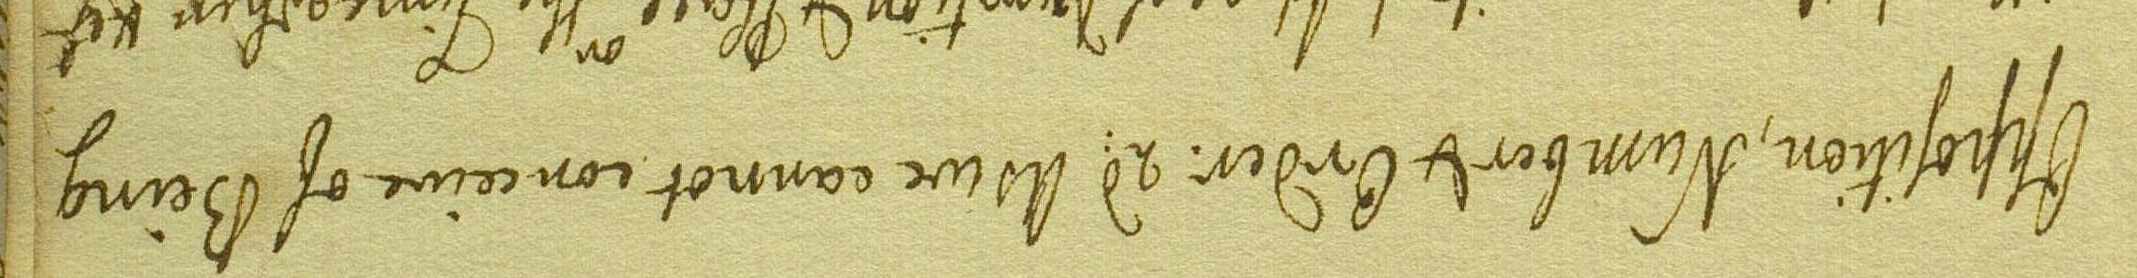Opposition, Number & Order. 2^d: As we cannot conceive of Being
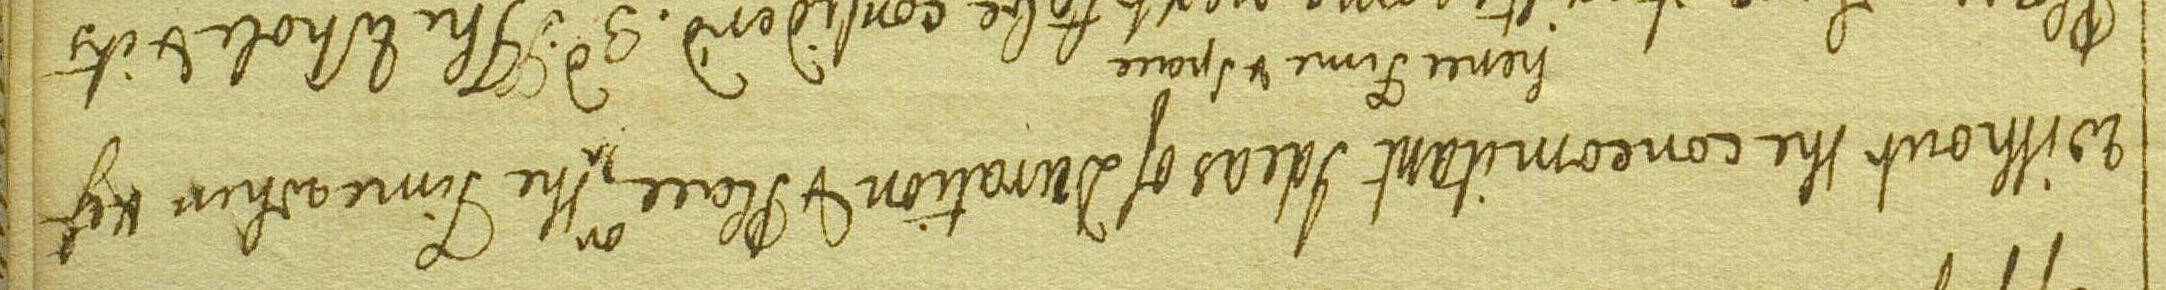without the concomitant Ideas of Duration & Place, ^or the Time when y^e
